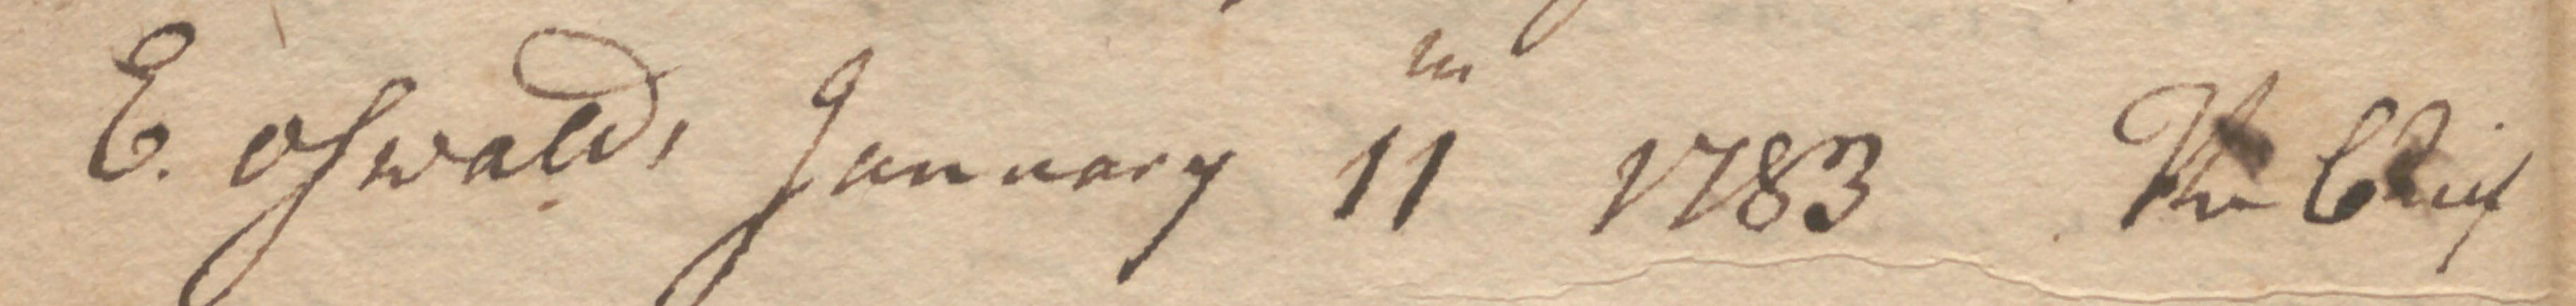E. oswalds January 11^th 1783 The Chief
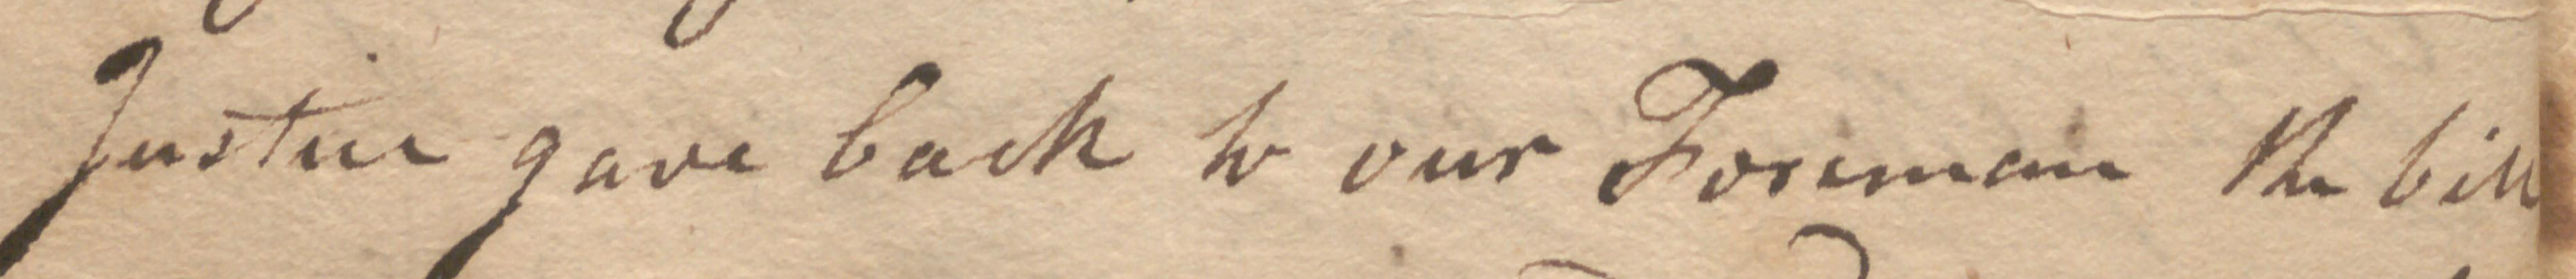Justice gave back to our Foreman the bill
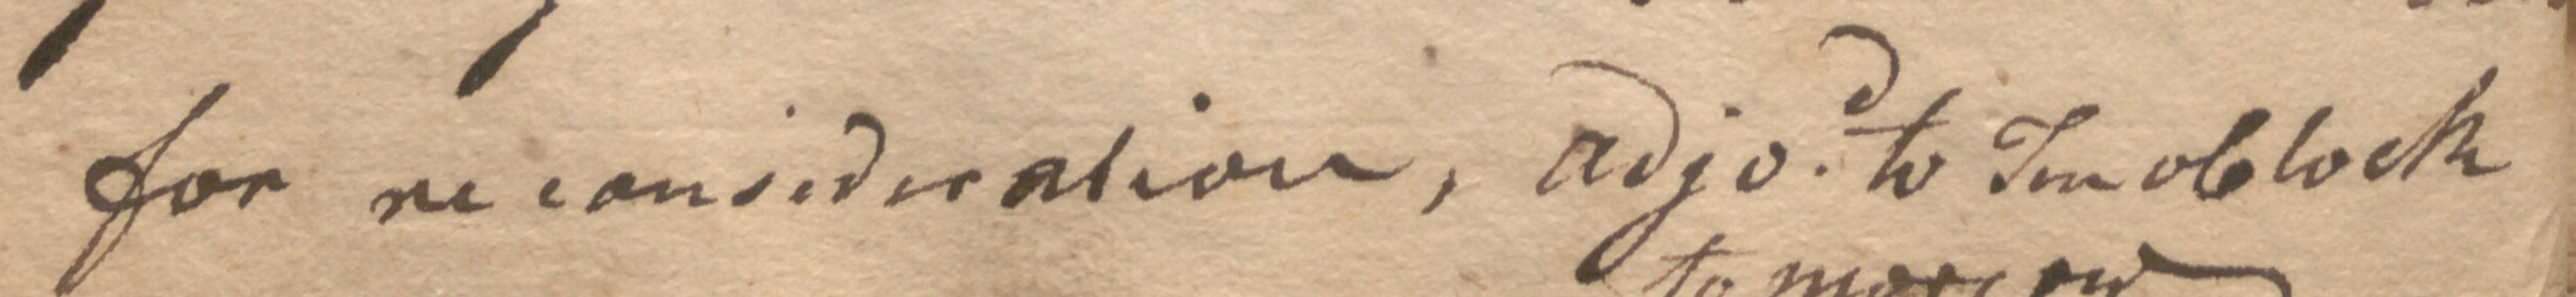for reconsideration, Adjo^d. to Ten oClock
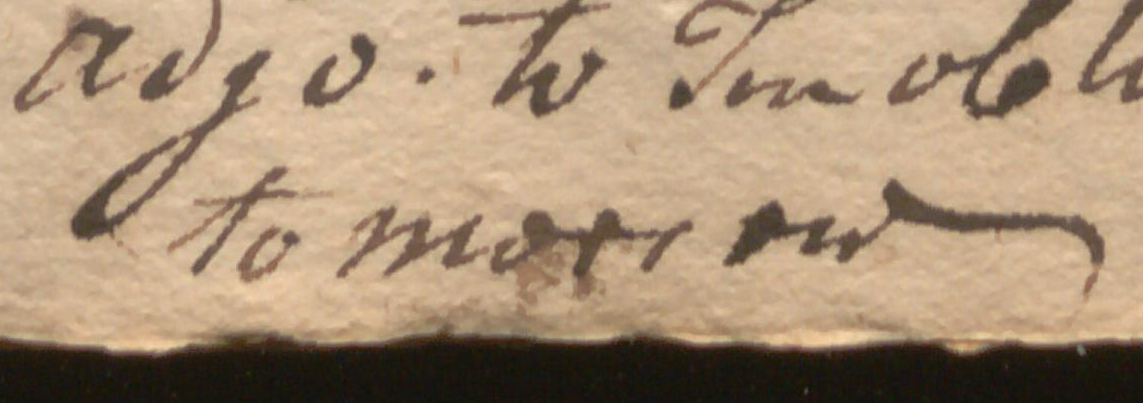to morrow
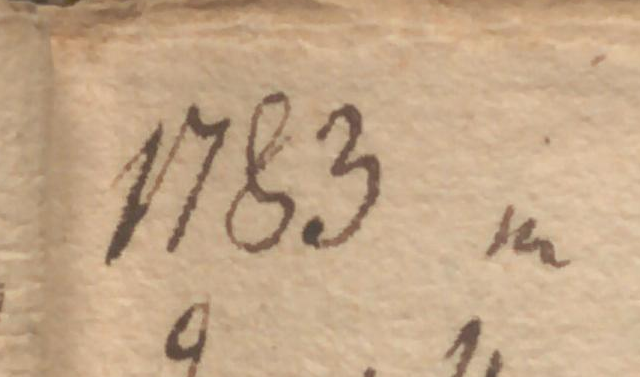1783
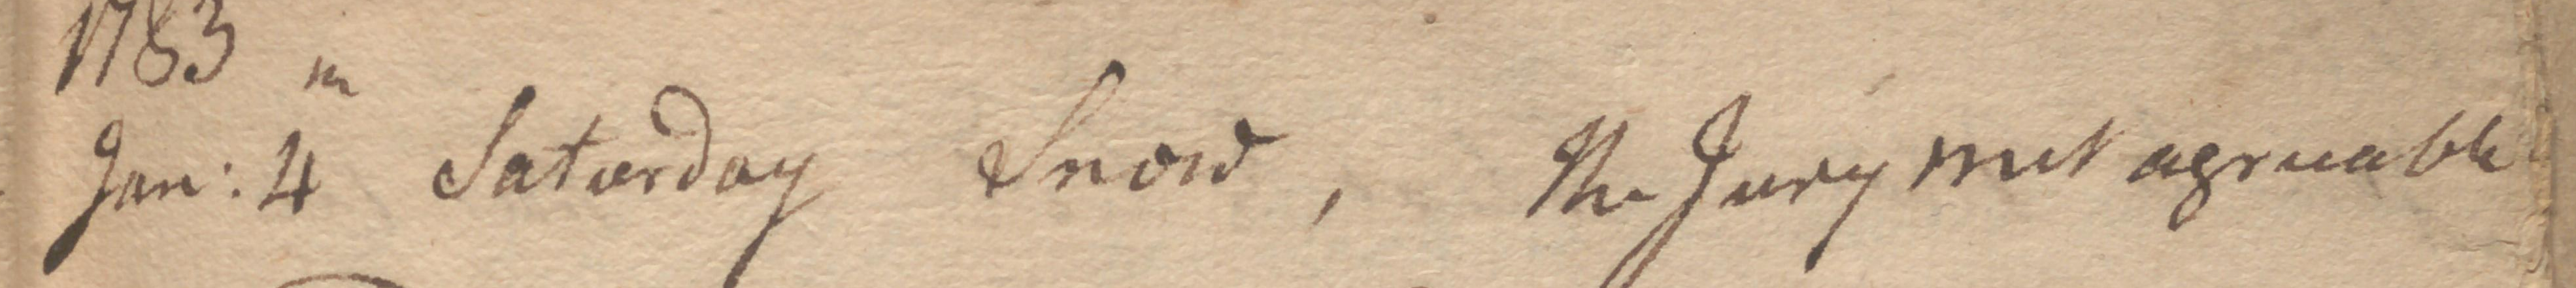Jan: 4 Saturday Snow, the Jury met agreeable
